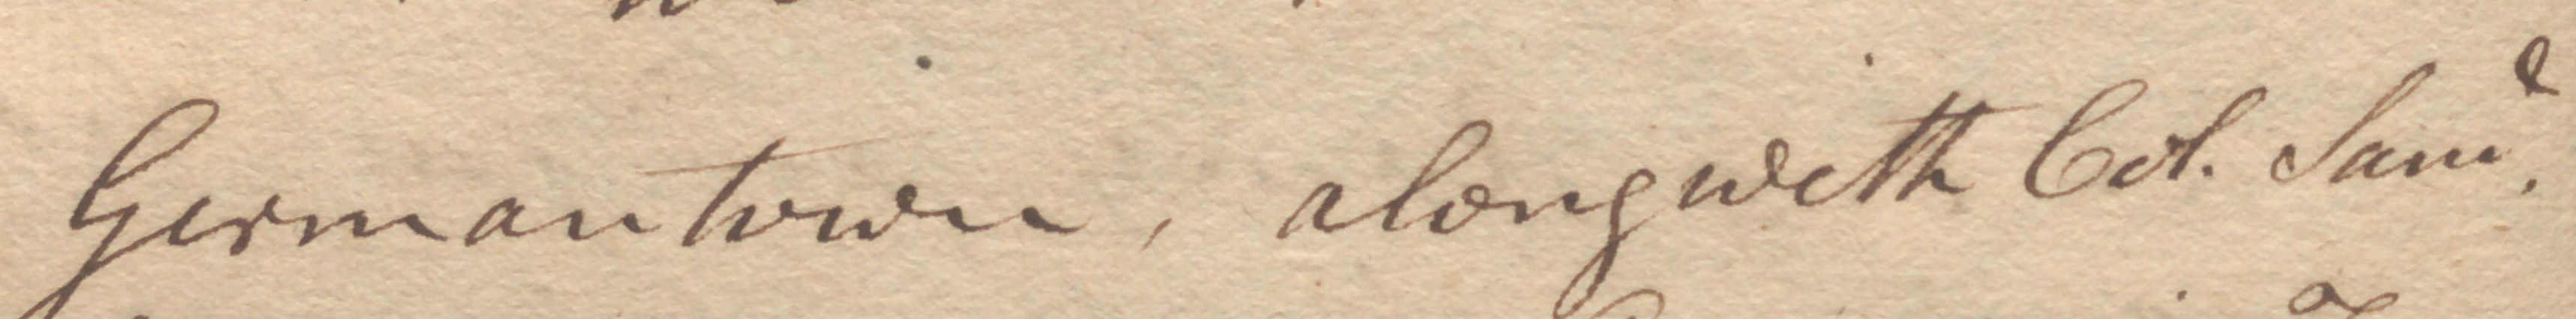Germantown, along with Col. Sam^l.
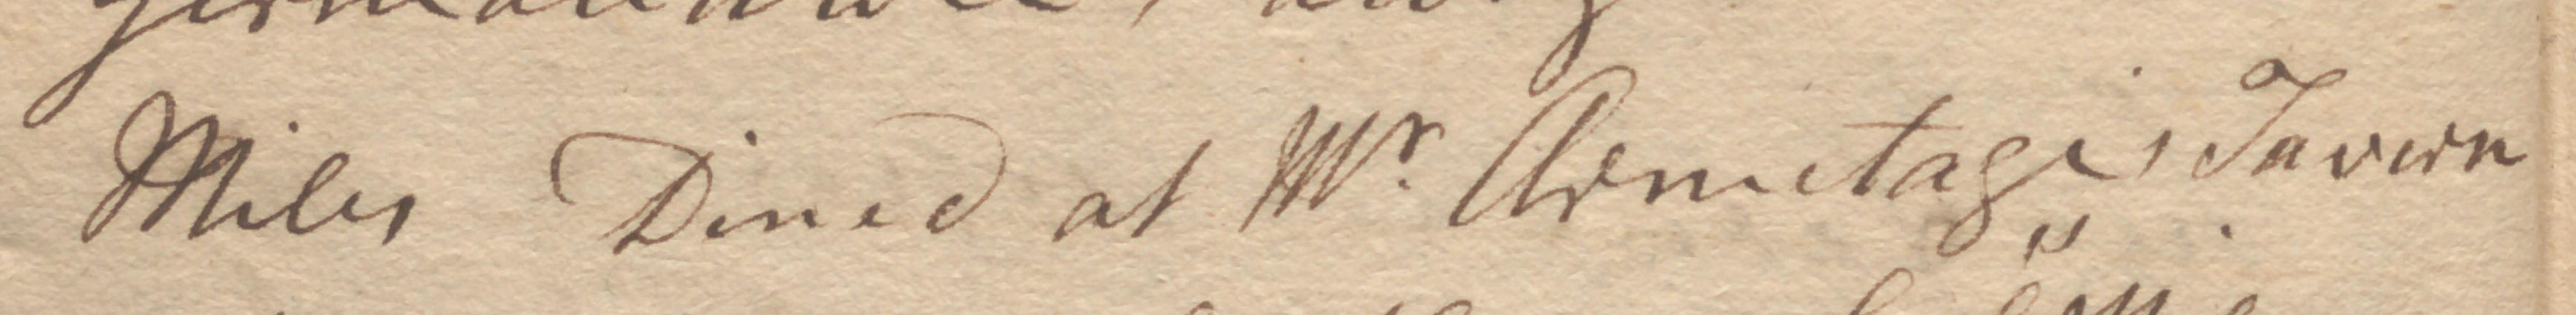Miles Dined at M^r. Armitages Tavern
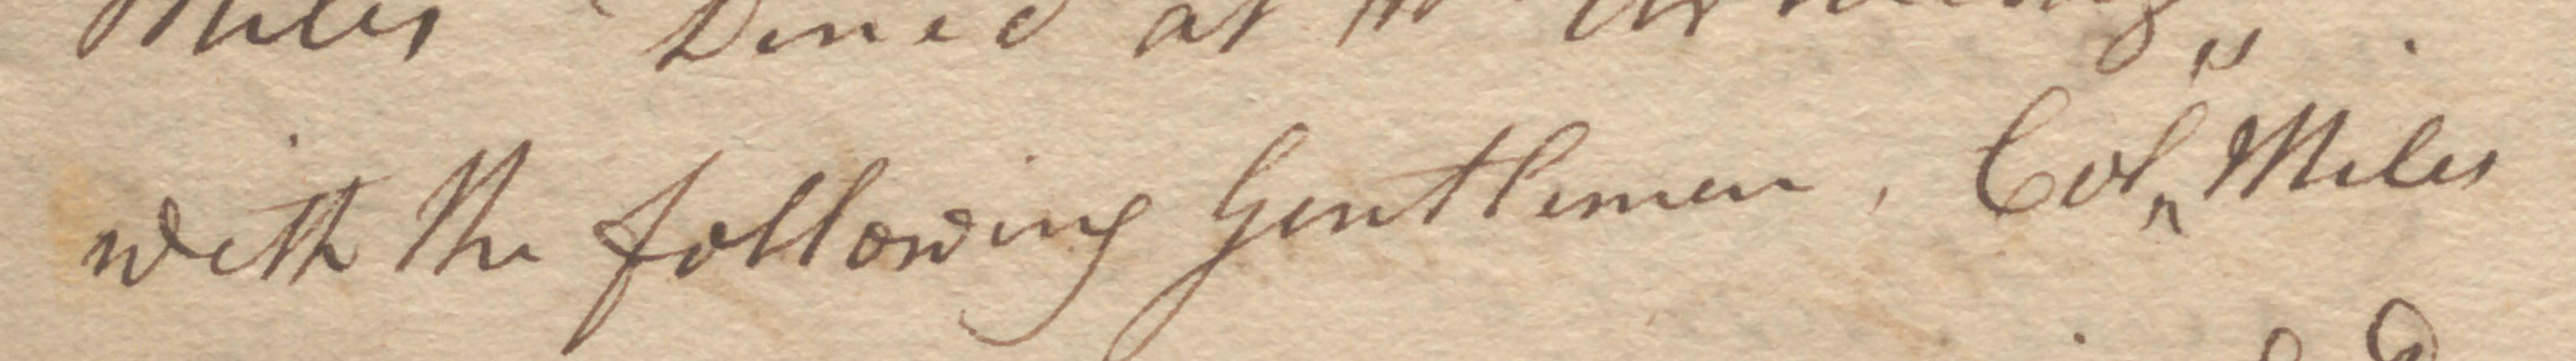with the following Gentlemen. Col^ls. Miles
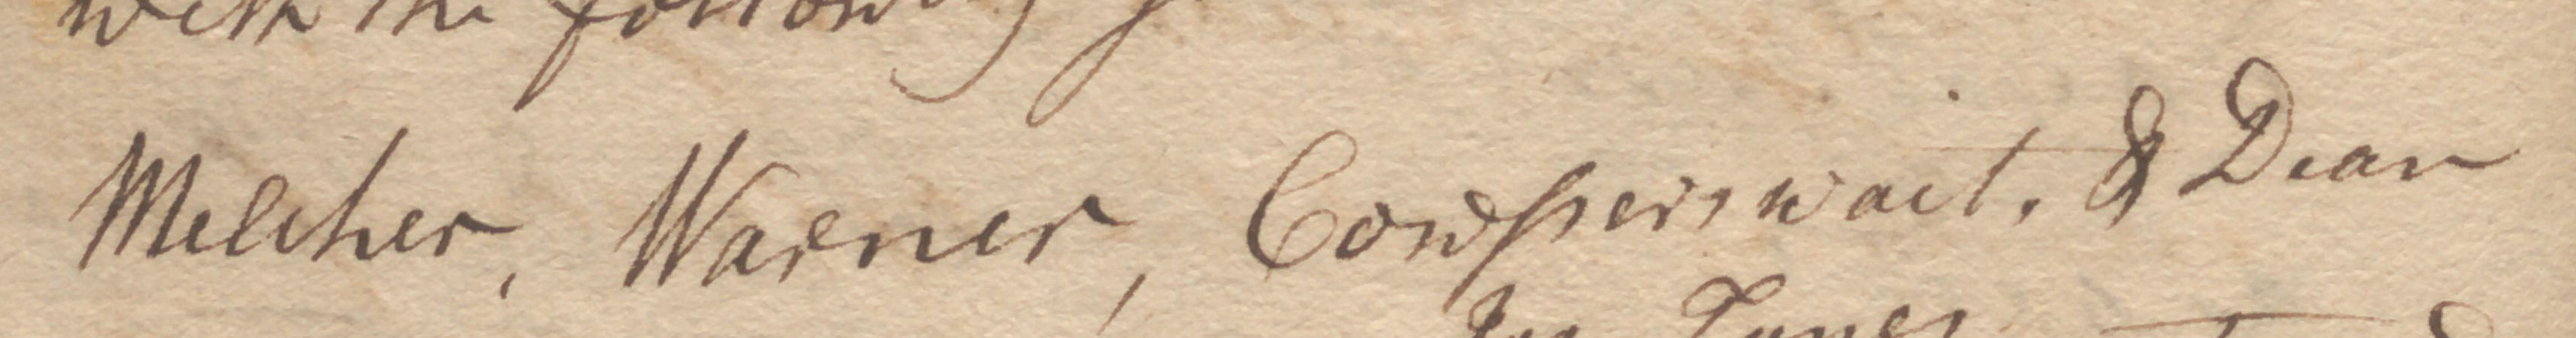Melcher, Warner Cowperswait, & Dean
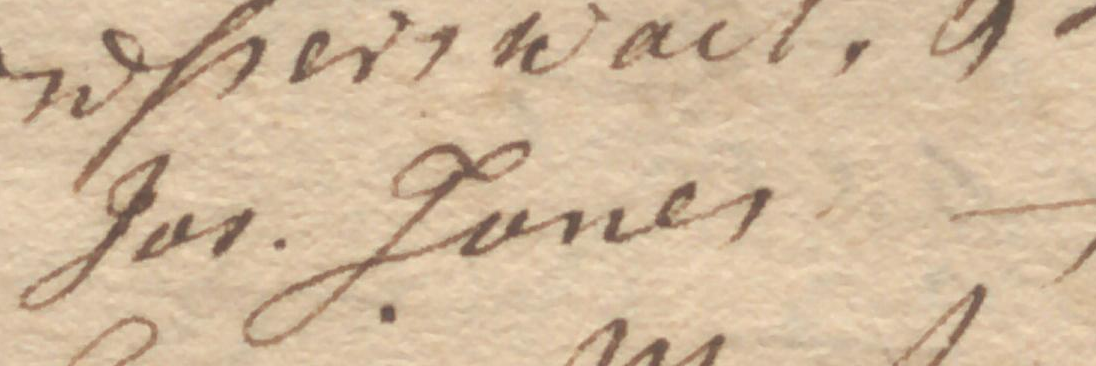Jos. Jones
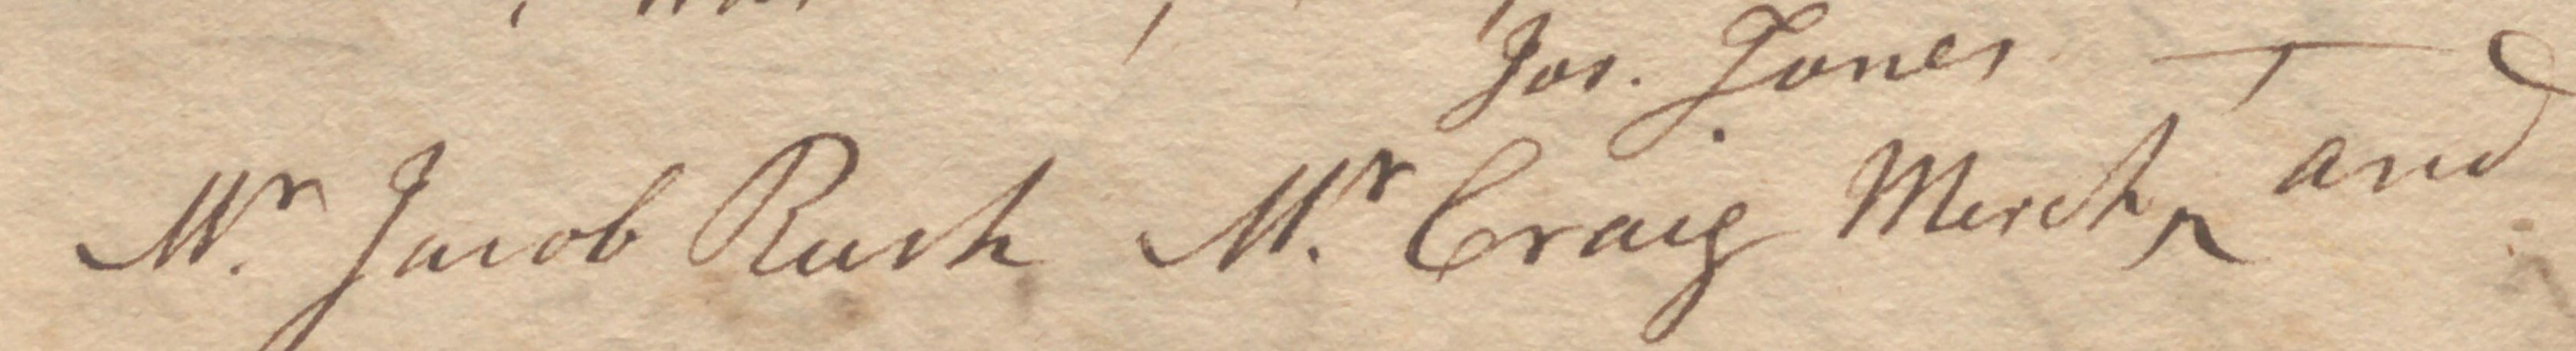M^r. Jacob Rush M^r. Craig Merch^t, and
